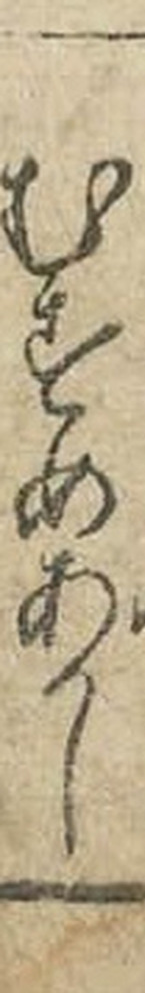むすめあかし
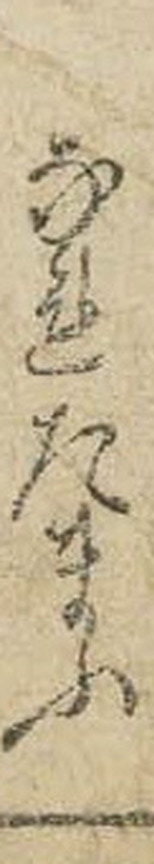なれたまふ
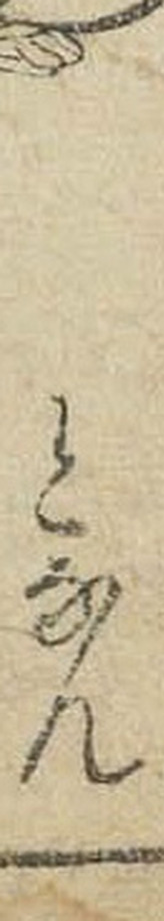となん
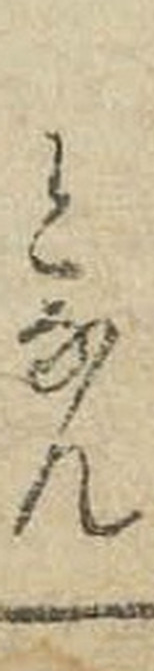となん
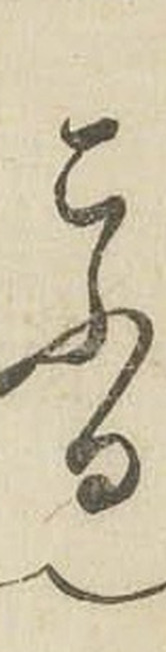こふる
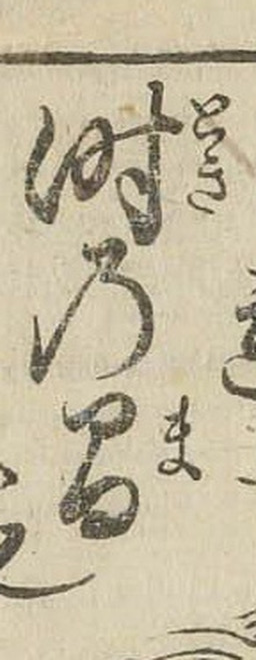時の間も
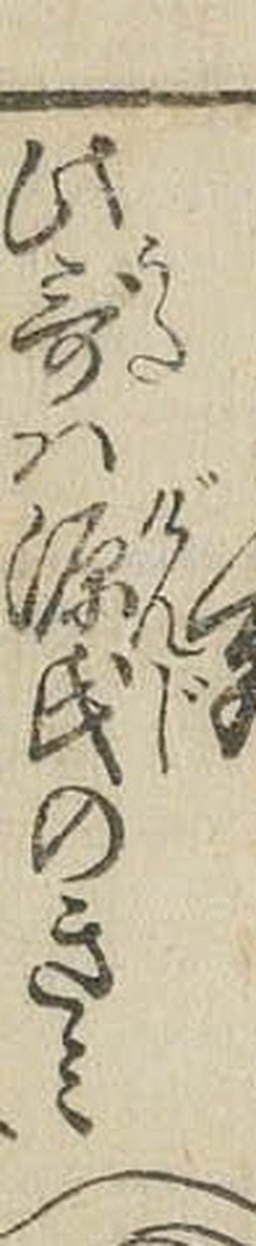此哥は源氏のきみ
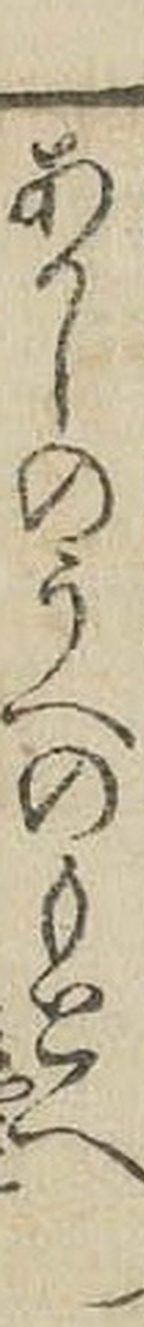あかしのうへのもとへ
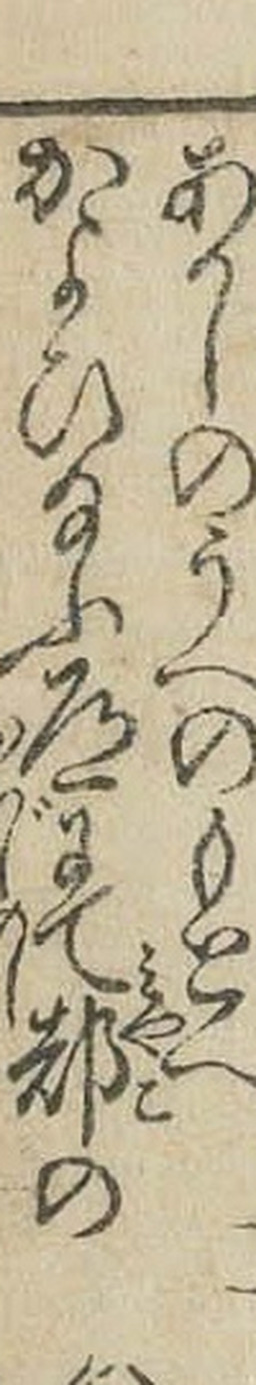かよひ給ふ道にて都の
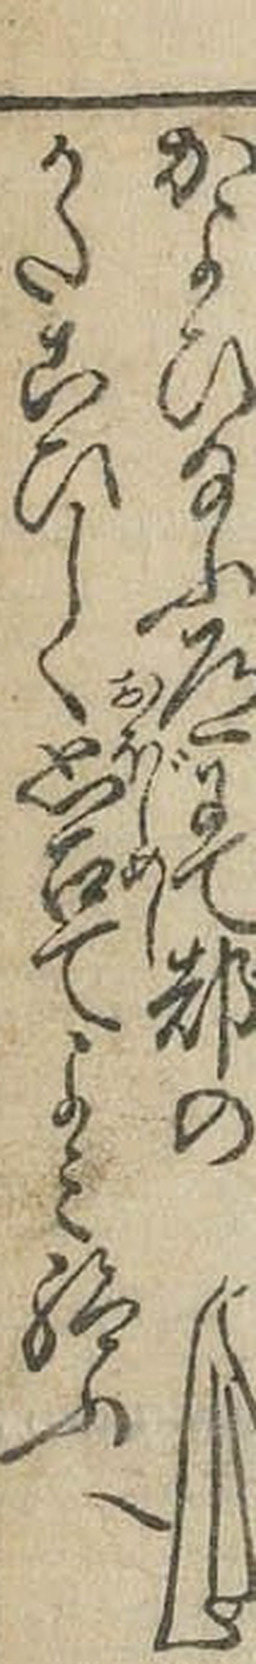かたこひしく思召てよみ給ふ

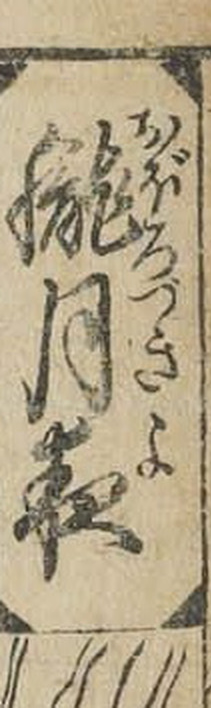朧月夜
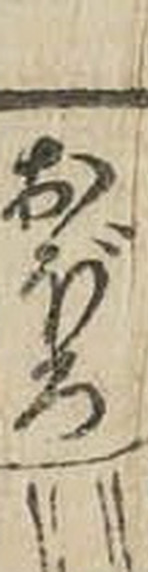おぼろ
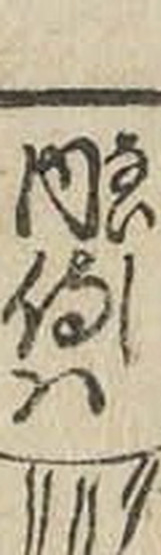内侍は
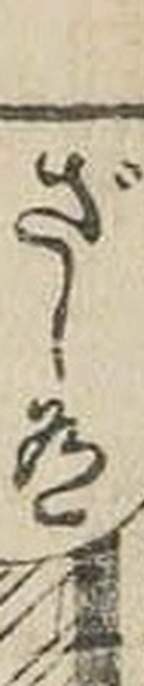ざし有
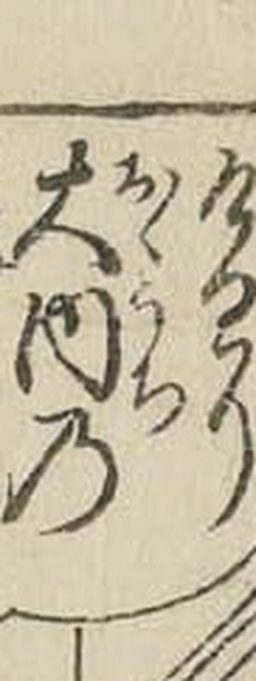大内の
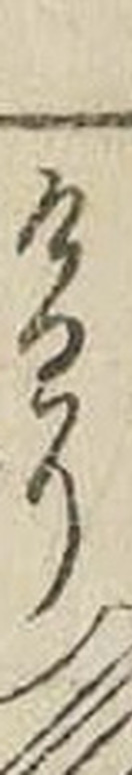けるに
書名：絵本写宝袋 9巻 1之巻
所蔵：東京学芸大学教育コンテンツアーカイブ
